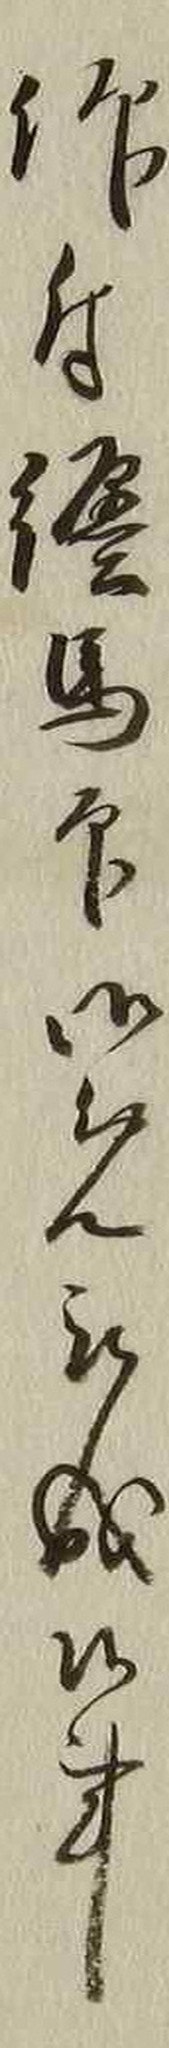仰付纏馬印御免被成候事
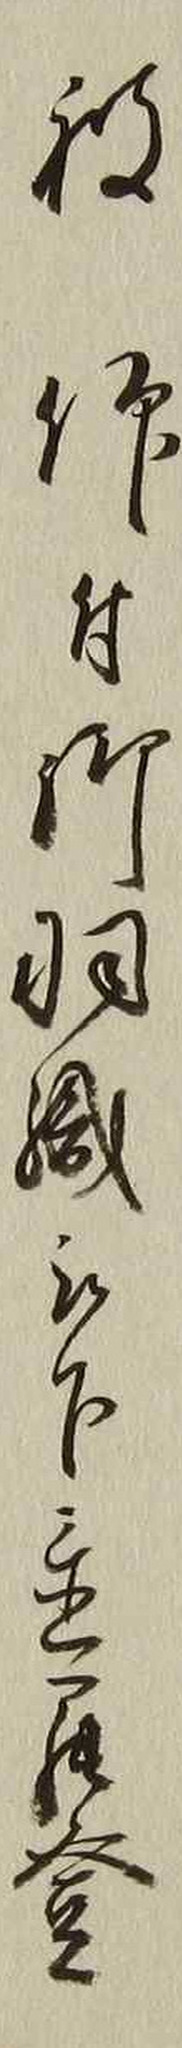被仰付御羽織被下置罷登
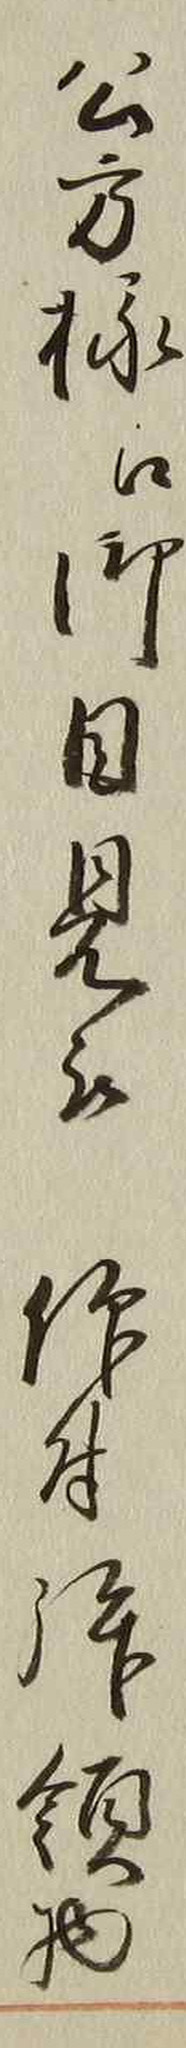公方様江御目見被仰付拝領物
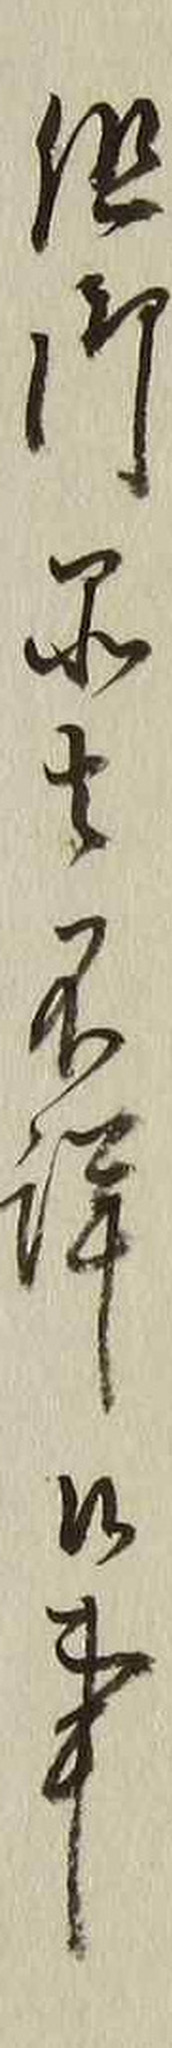但御品者不詳候事
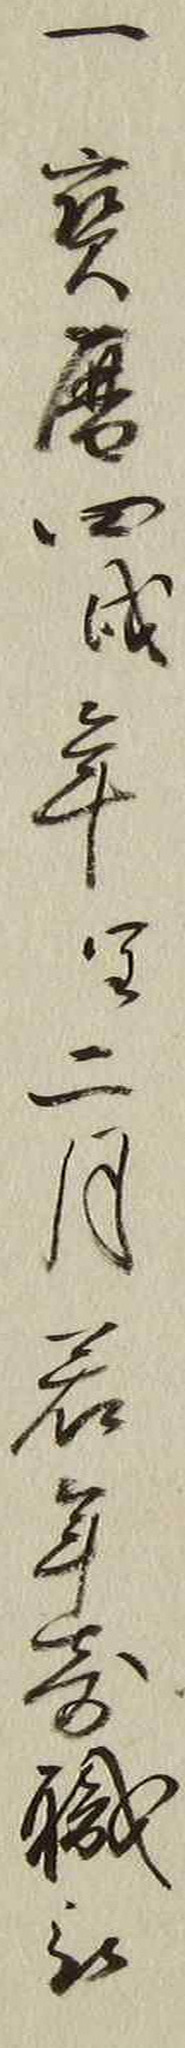一宝暦四戌年閏二月若年寄職被
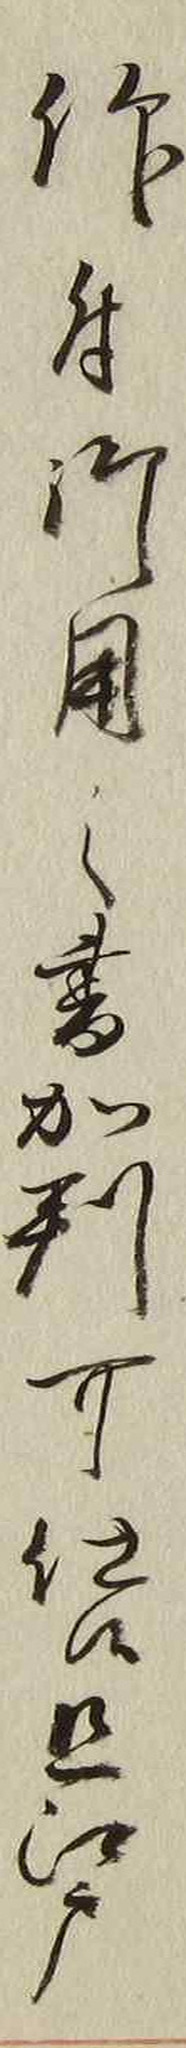仰付御用之書加判可仕候且江戸
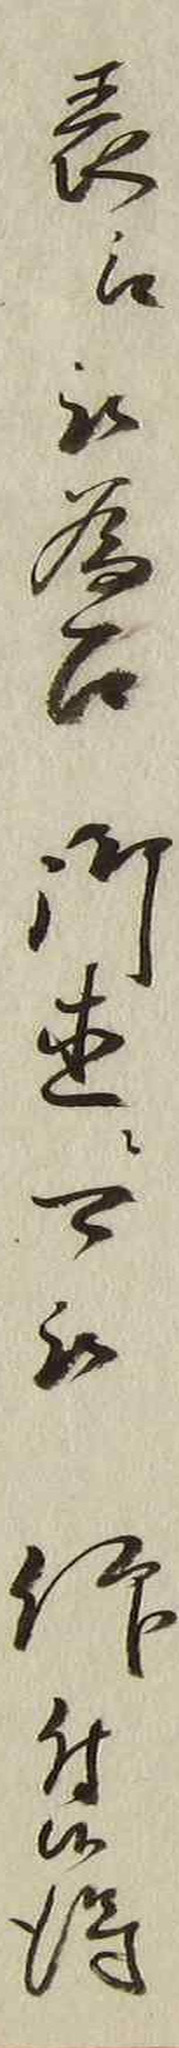表江被為召御直ニ可被仰付候得
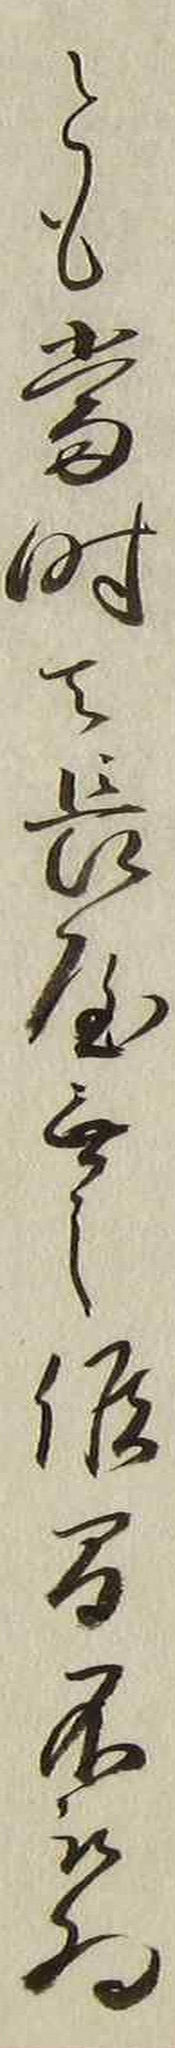とも当時者長屋無之候間不被為
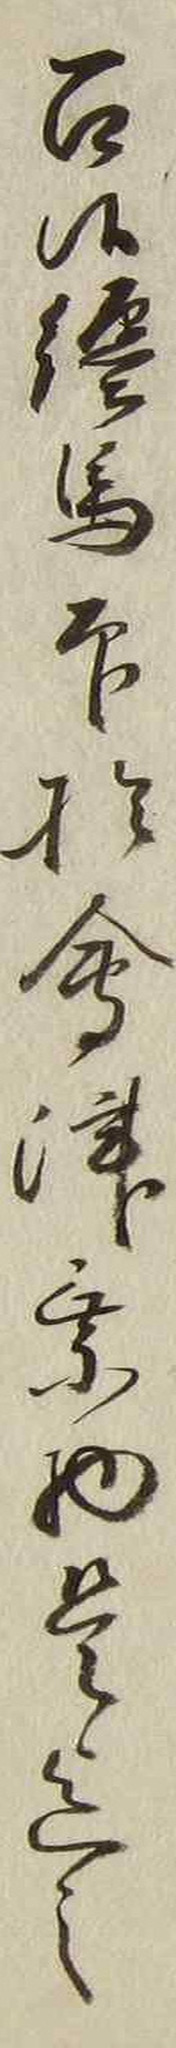召候纏馬印於会津乗物是迄之
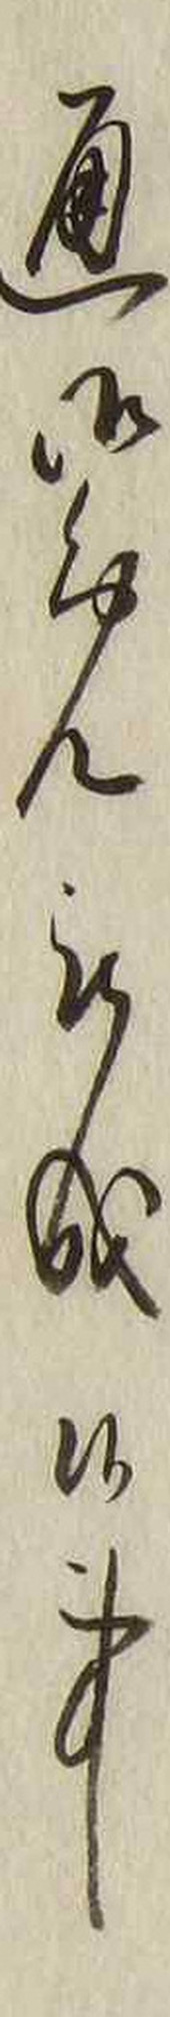通御免被成候事

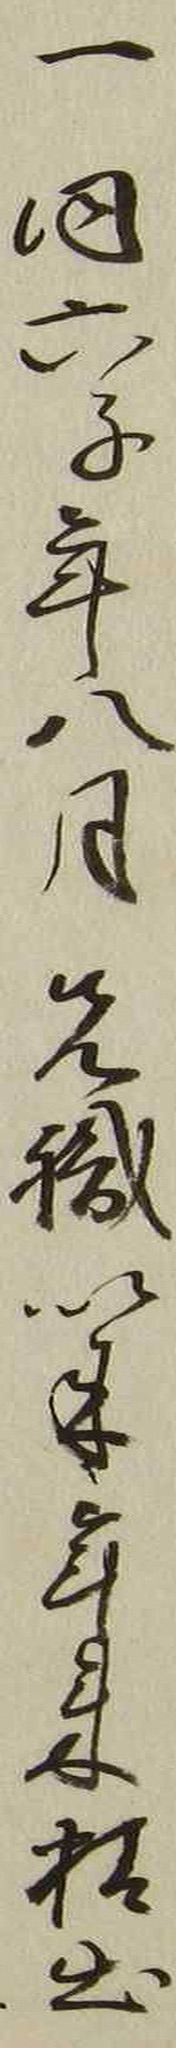一同六子年八月先職以来年来精出
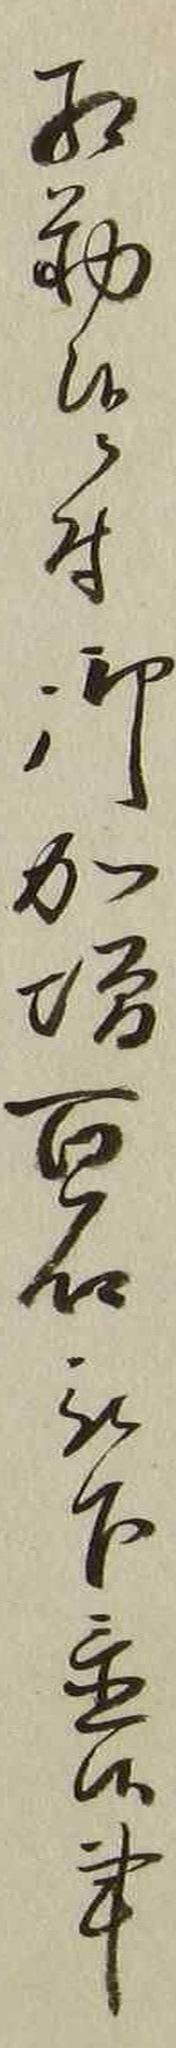相勤候ニ付御加増百石被下置候事
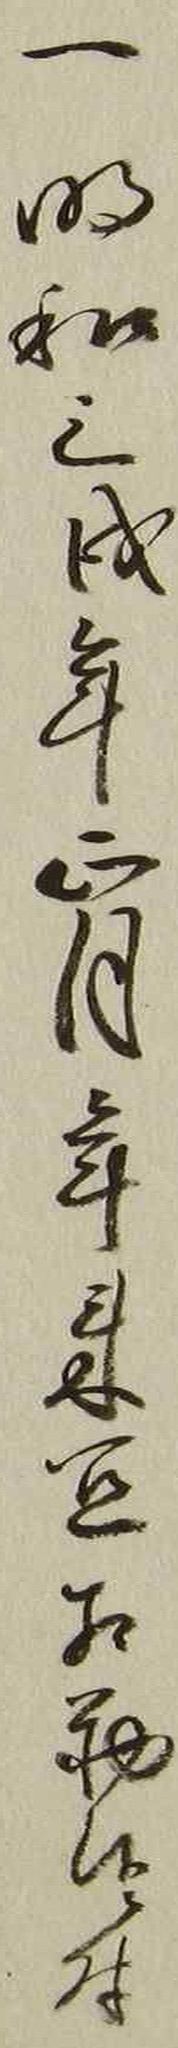一明和三戌年正月年来宜相勤候ニ付
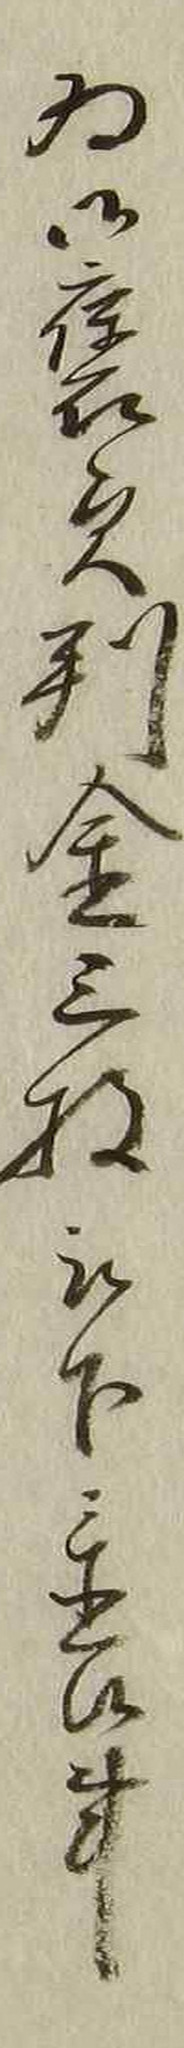為御褒美判金三枚被下置候事
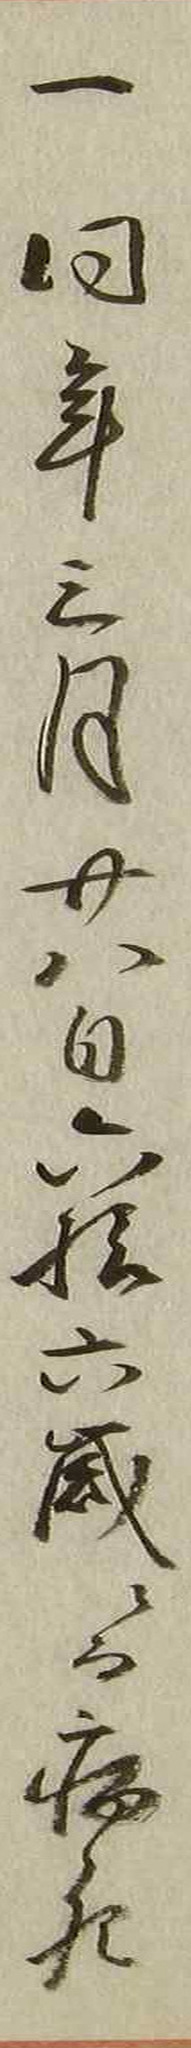一同年三月廿八日六拾六歳ニ而病死
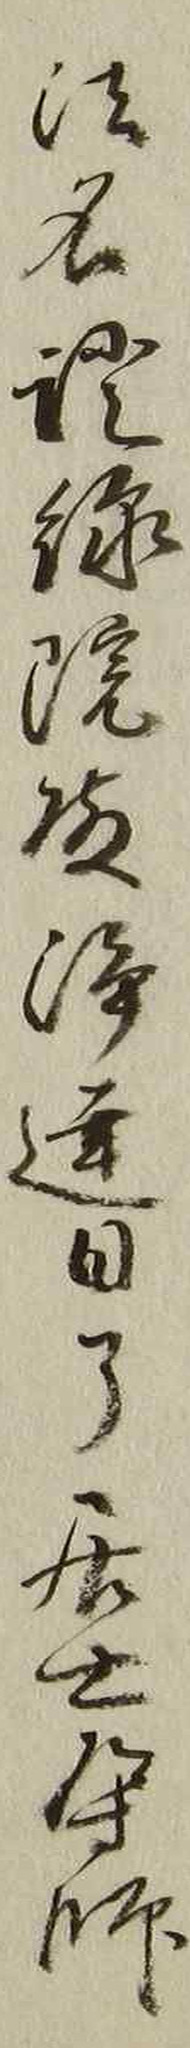法名証縁院殿浄達日了居士導師
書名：諸士系譜　巻之122　よ之部5
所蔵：会津若松市立会津図書館
